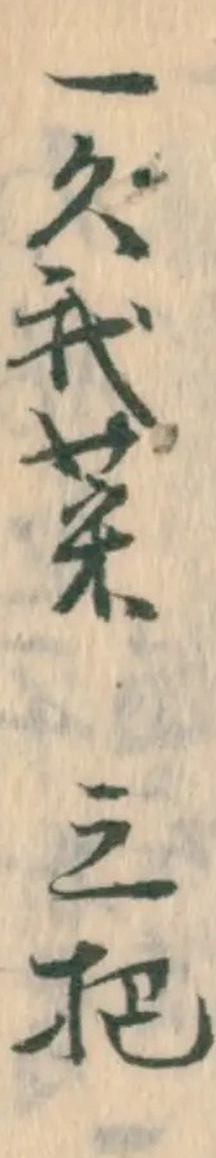一久我菜三把
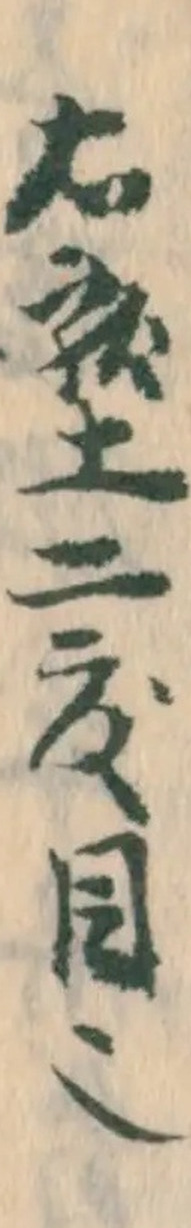右献上二度目也
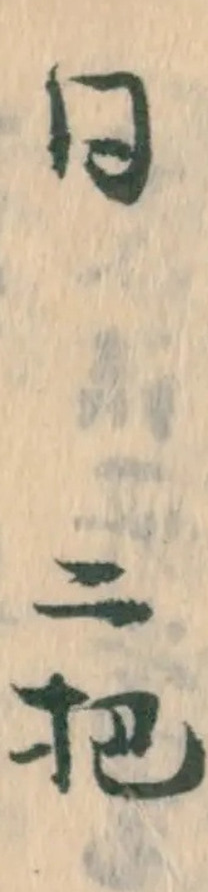同二把
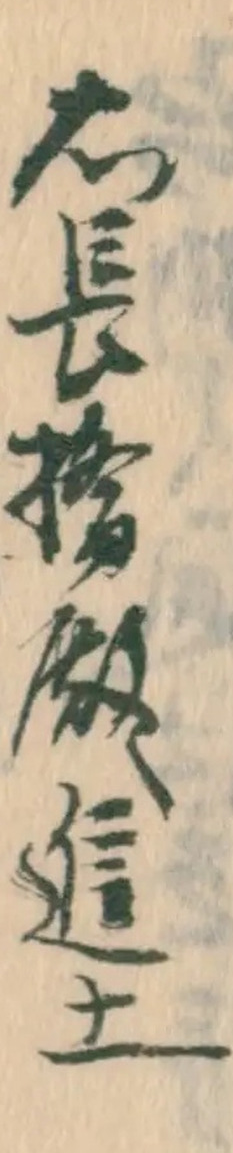右長橋殿へ進上
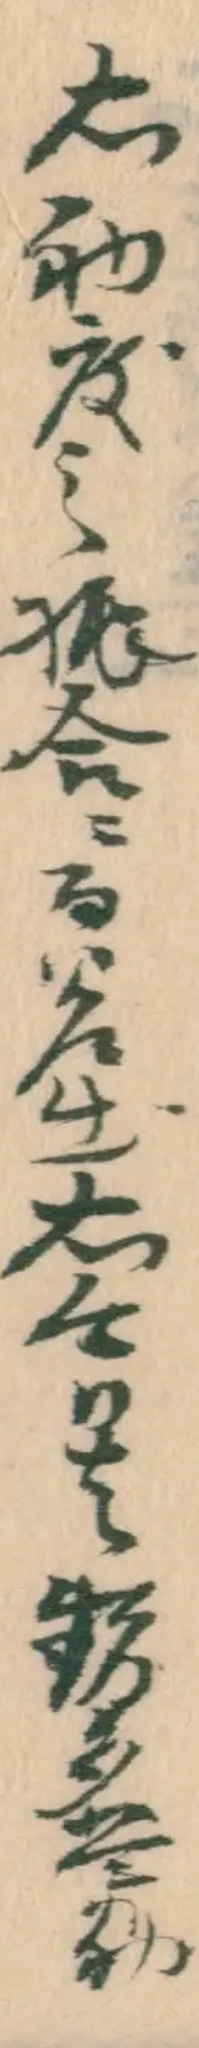右初度之振合ニ而差出右壬日は勢多豊州
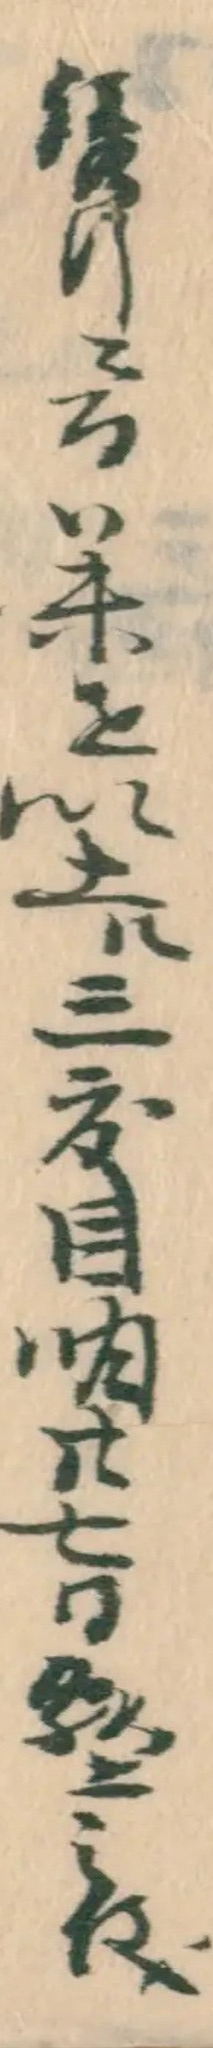誘引ニ而御末を以上ル三度目明廿七日献上之儀
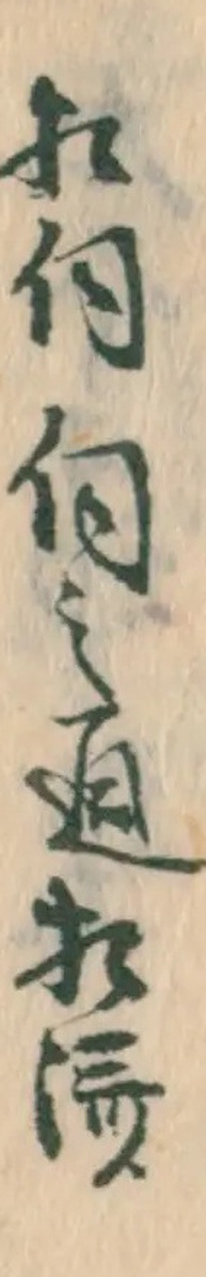相伺伺之通相済
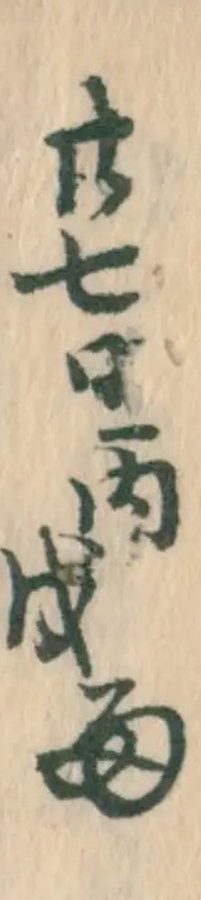廿七日丙戌雨
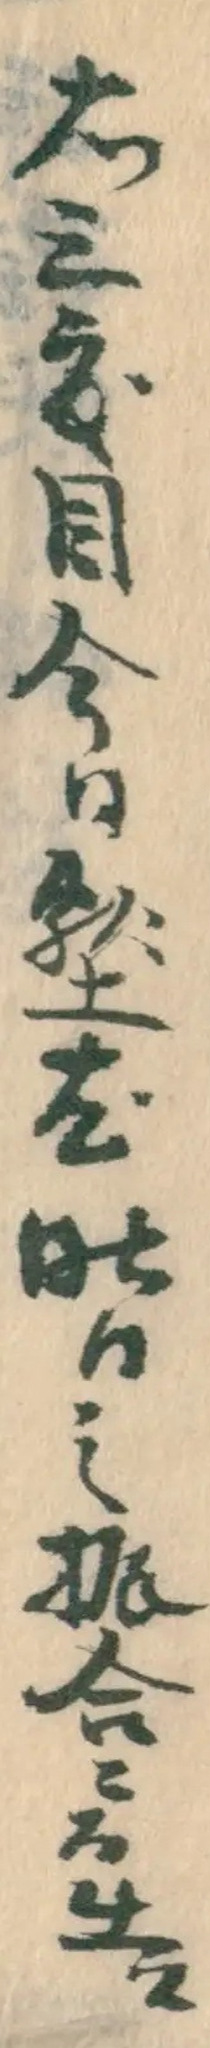右三度目今日献上尤明日之振合ニ而出ス
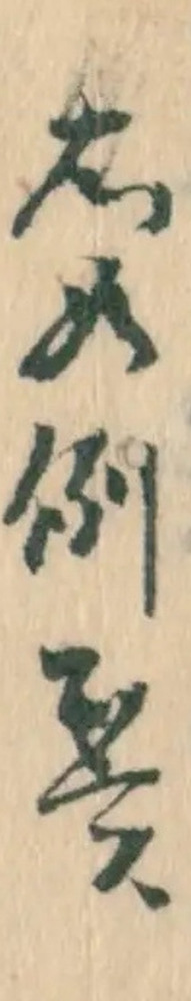右如例遣ス

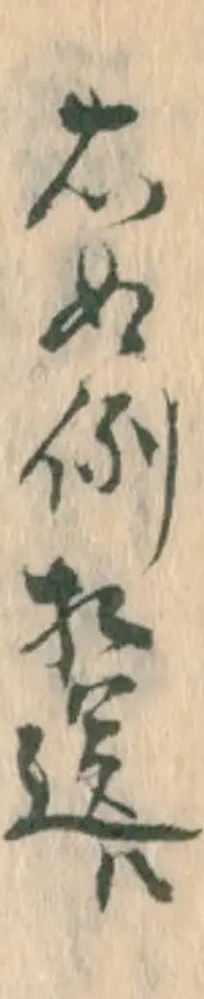右如例相送ル
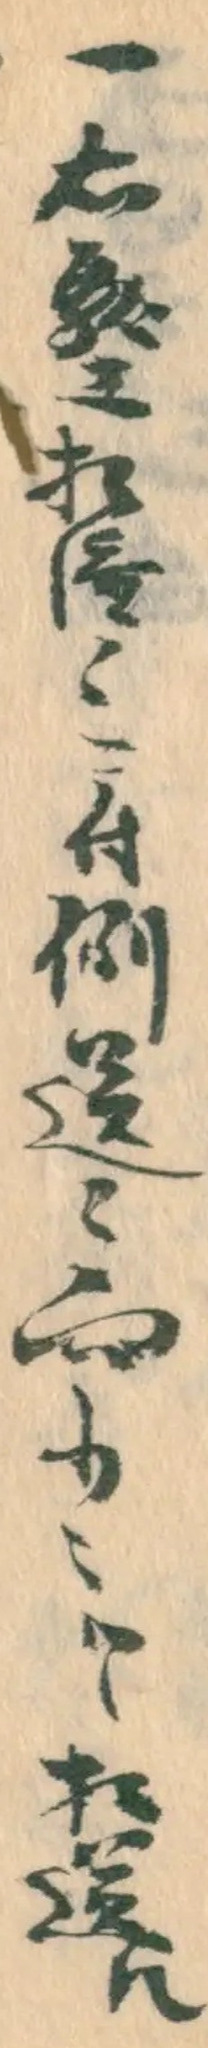一右献上相済候ニ付例送ニ而少々ツヽ相送ル
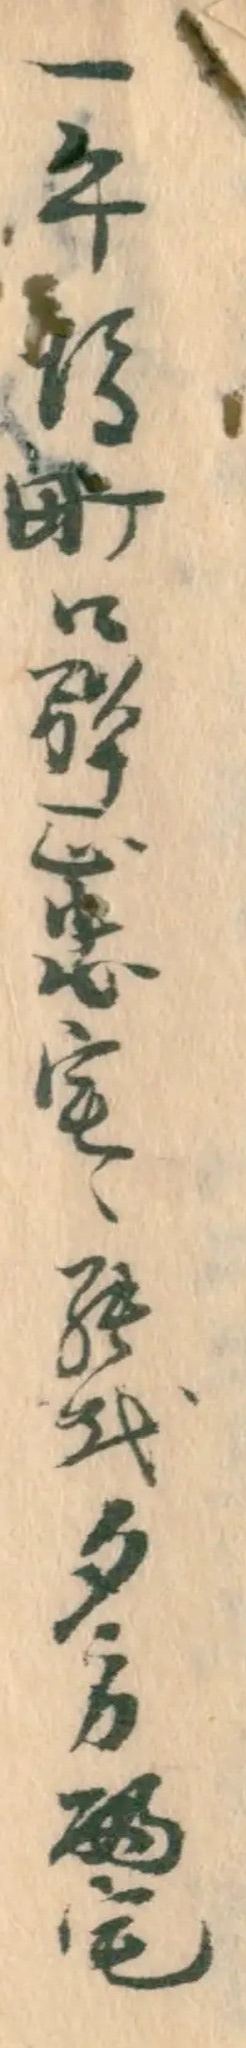一午後町口弾正忠宅へ罷越夕方帰宅
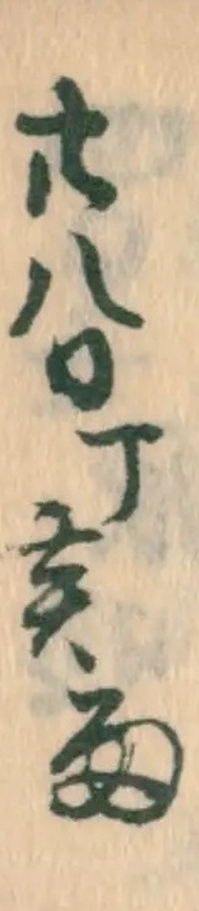廿八日丁亥雨
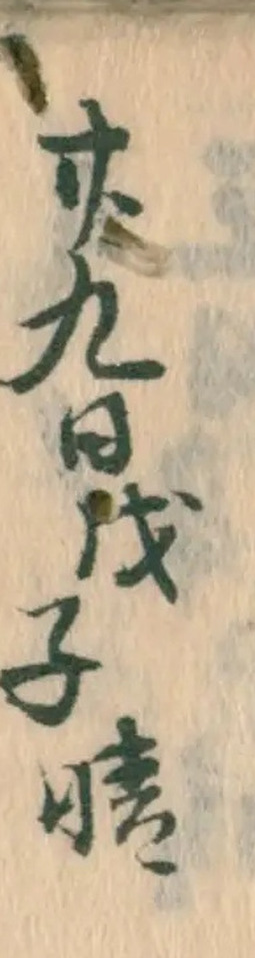廿九日戊子晴
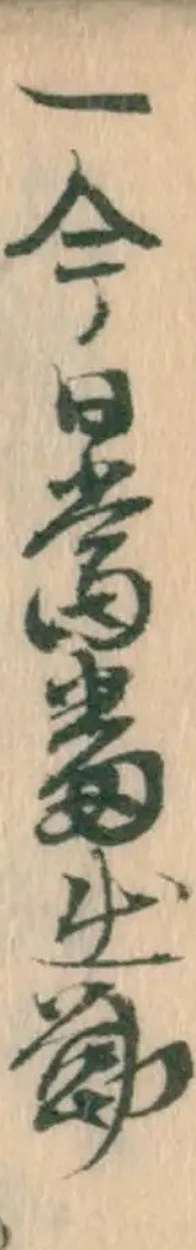一今日当番出勤
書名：禁裏御所御用日記. [131]
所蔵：国立国会図書館 National Diet Library, JAPAN
